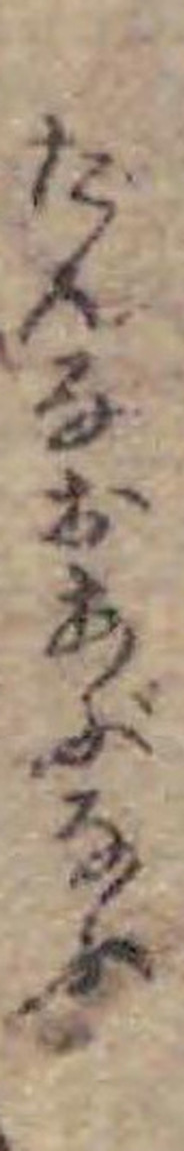だんなおあぶなふ
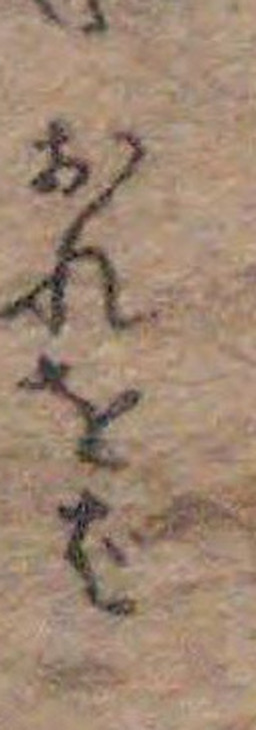おれをば
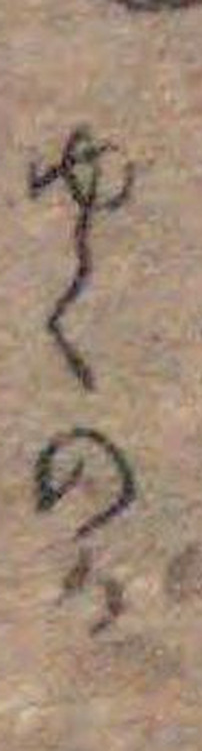ゆくのか
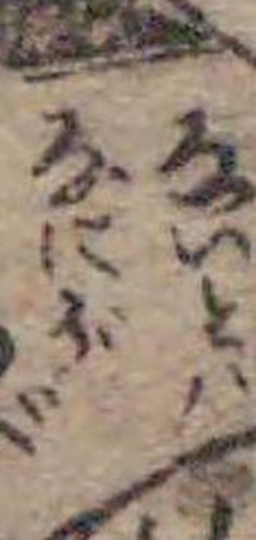なにが
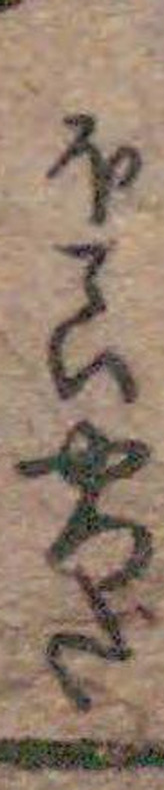ほていやつだ
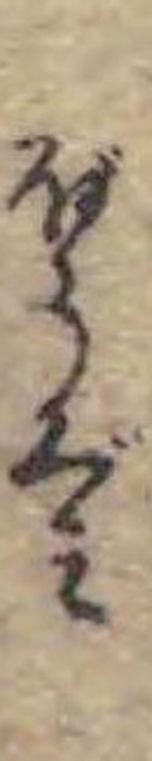ぼうぐみ
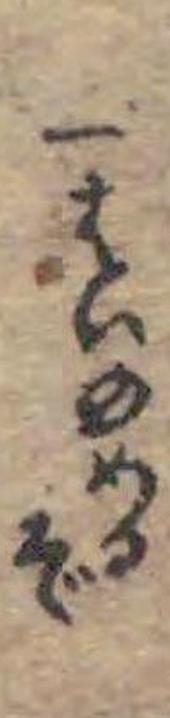一はいのめる
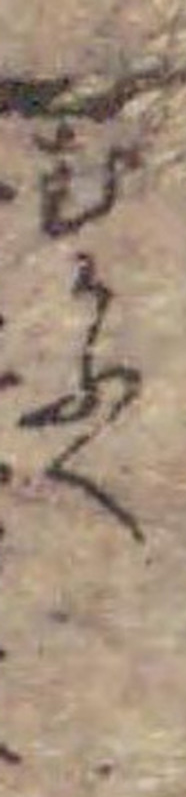むかふへ
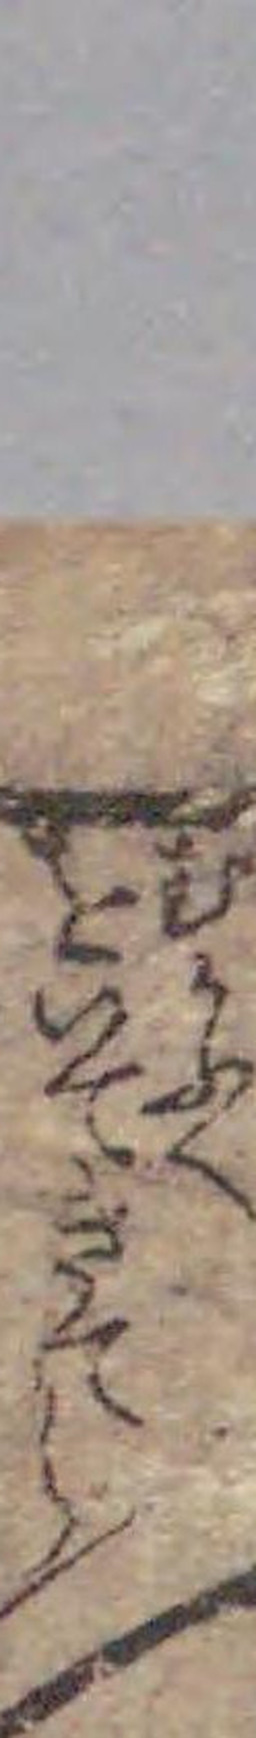をいてきてから
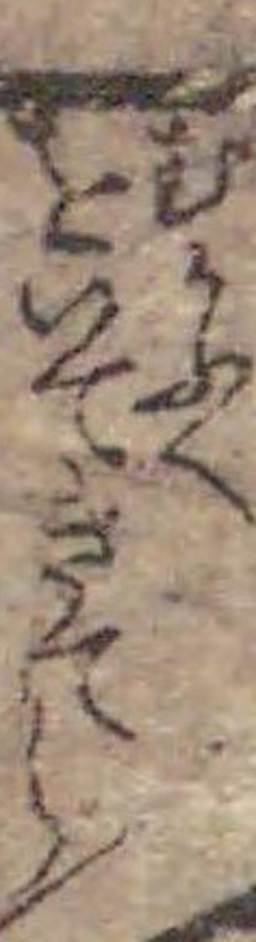をいてきてから
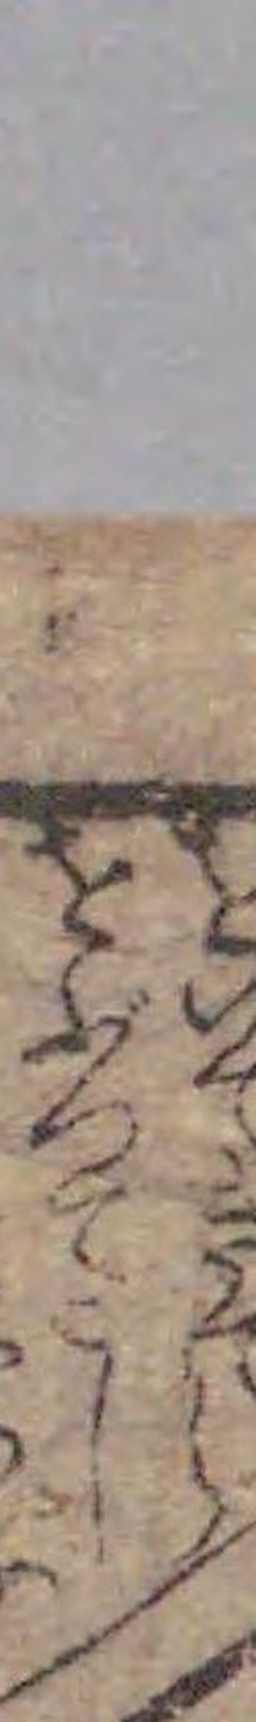をぶつてこし
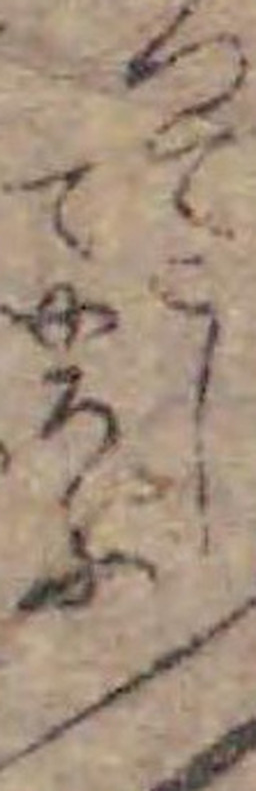てやろふ
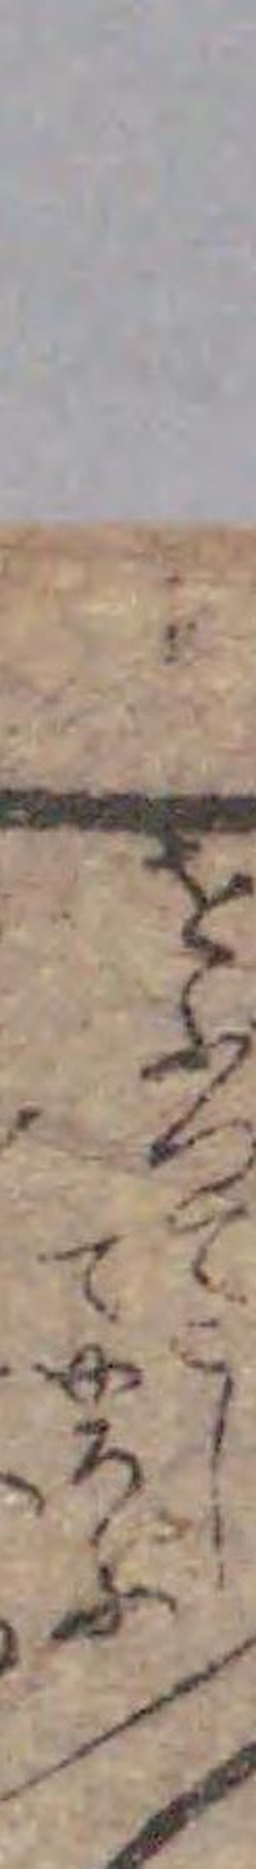てやろふ
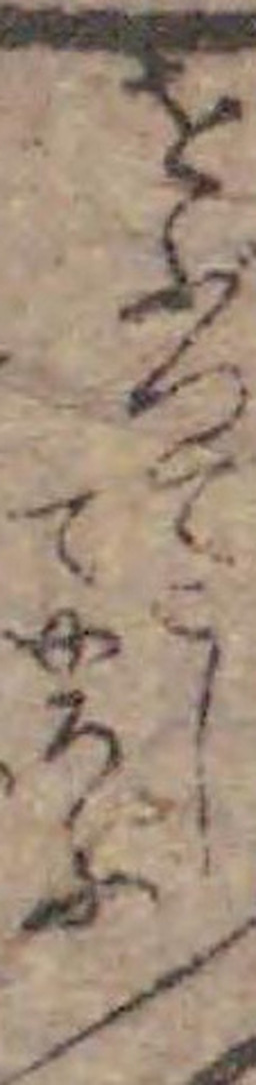てやろふ
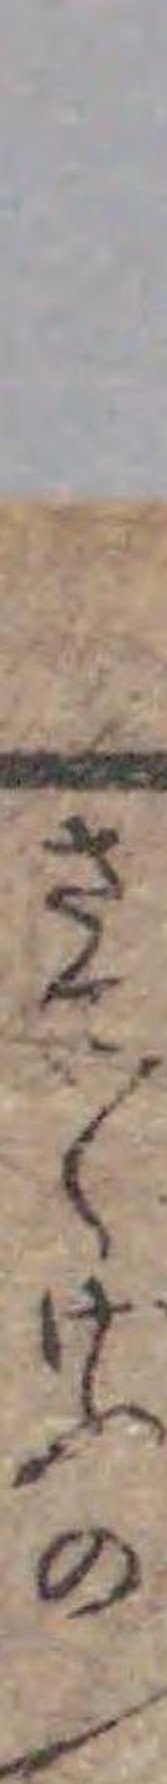さて〳〵けふの
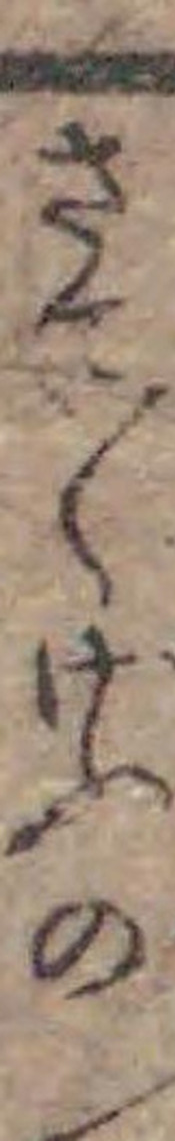さて〳〵けふの
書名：蛭子大黒壮年過 : 2巻
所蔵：国立国会図書館 National Diet Library, JAPAN
